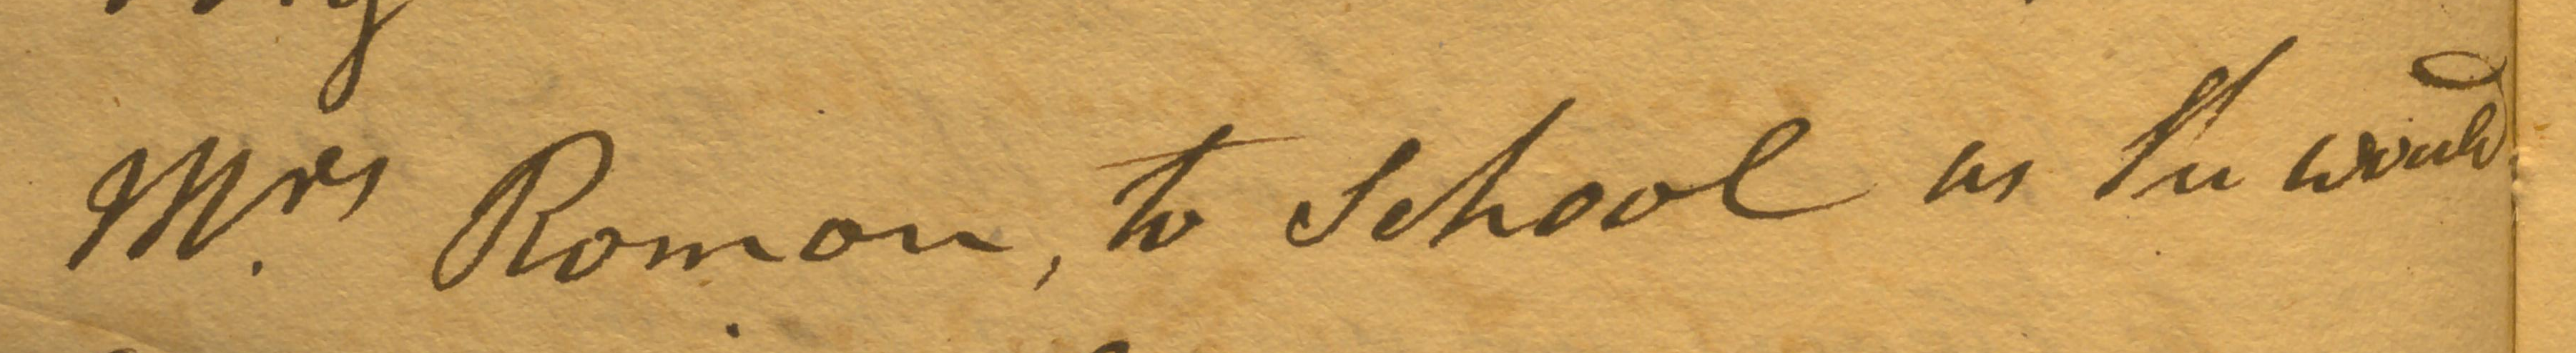M^rs. Romon, to School as she would
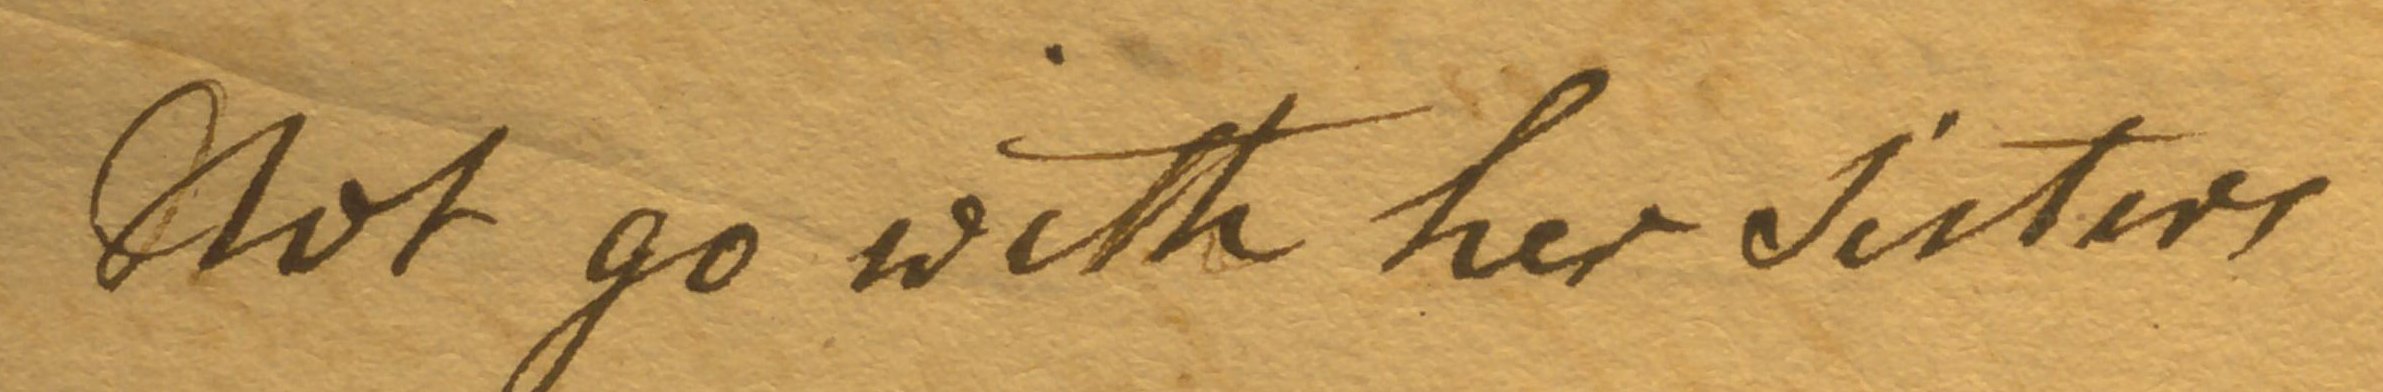Not go with her Sisters
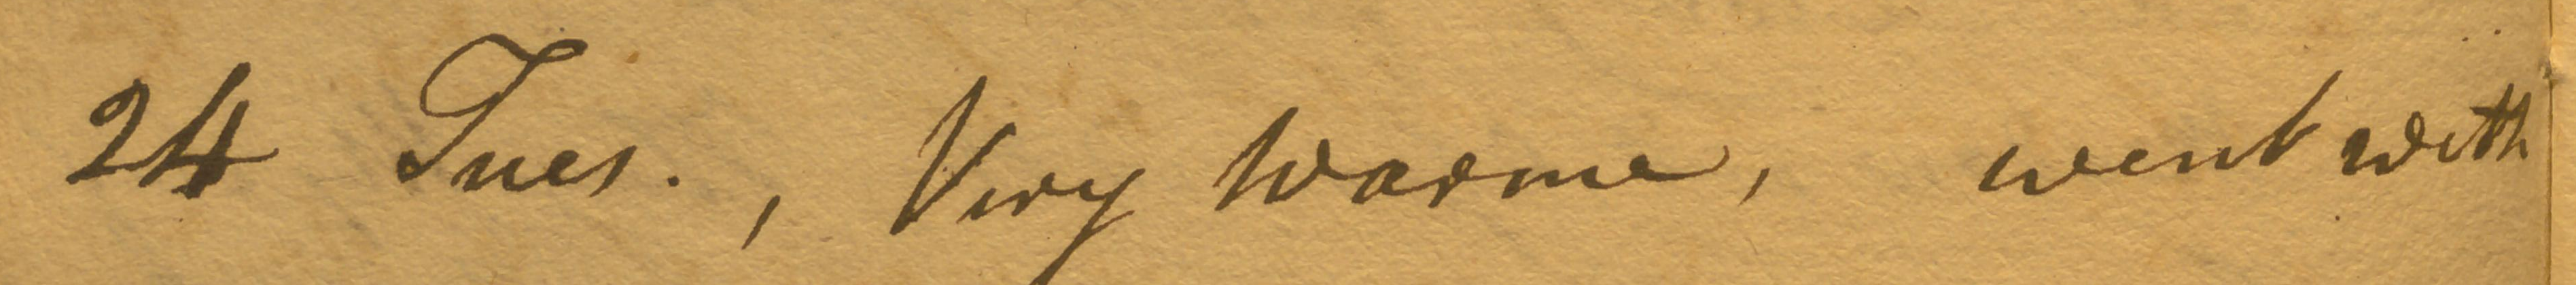24 Tues., Very warme, went with
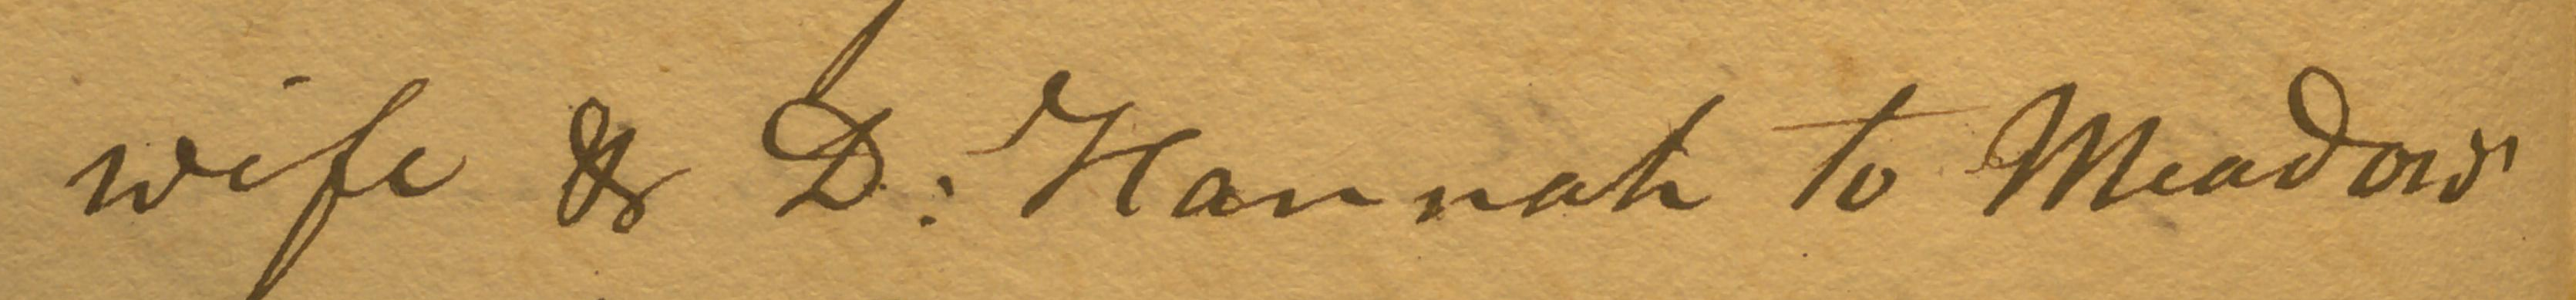wife & D: Hannah to Meadow
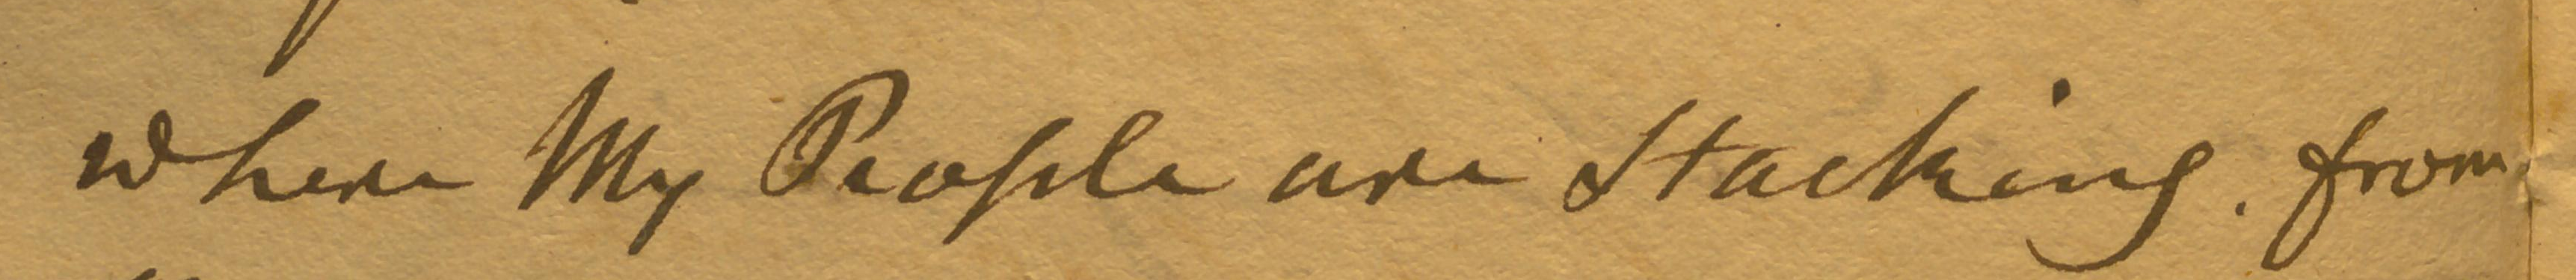where My People are Stacking. from
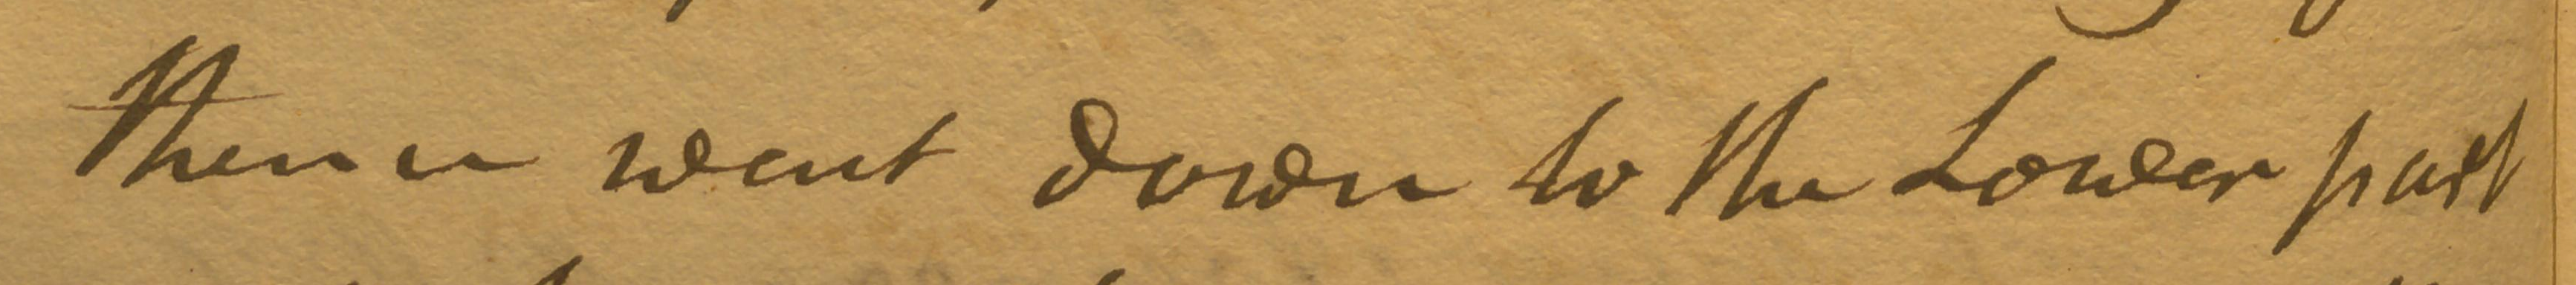thence went down to the Lower part
